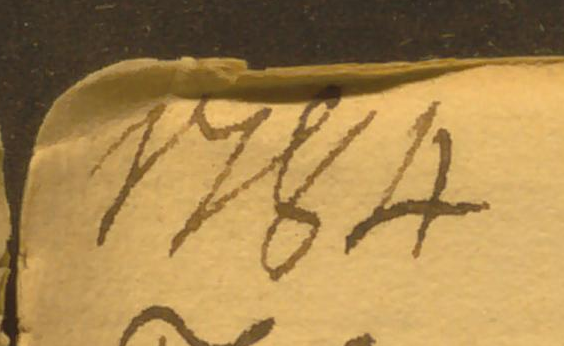1784
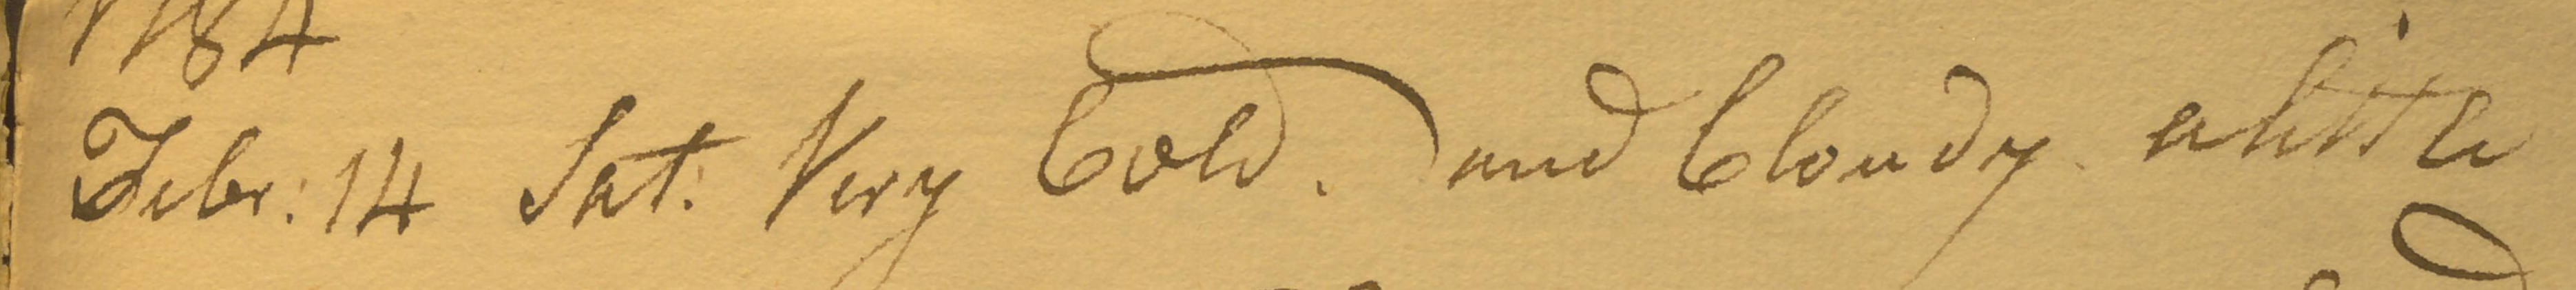Febr. 14 Sat. Very Cold. and Cloudy a little
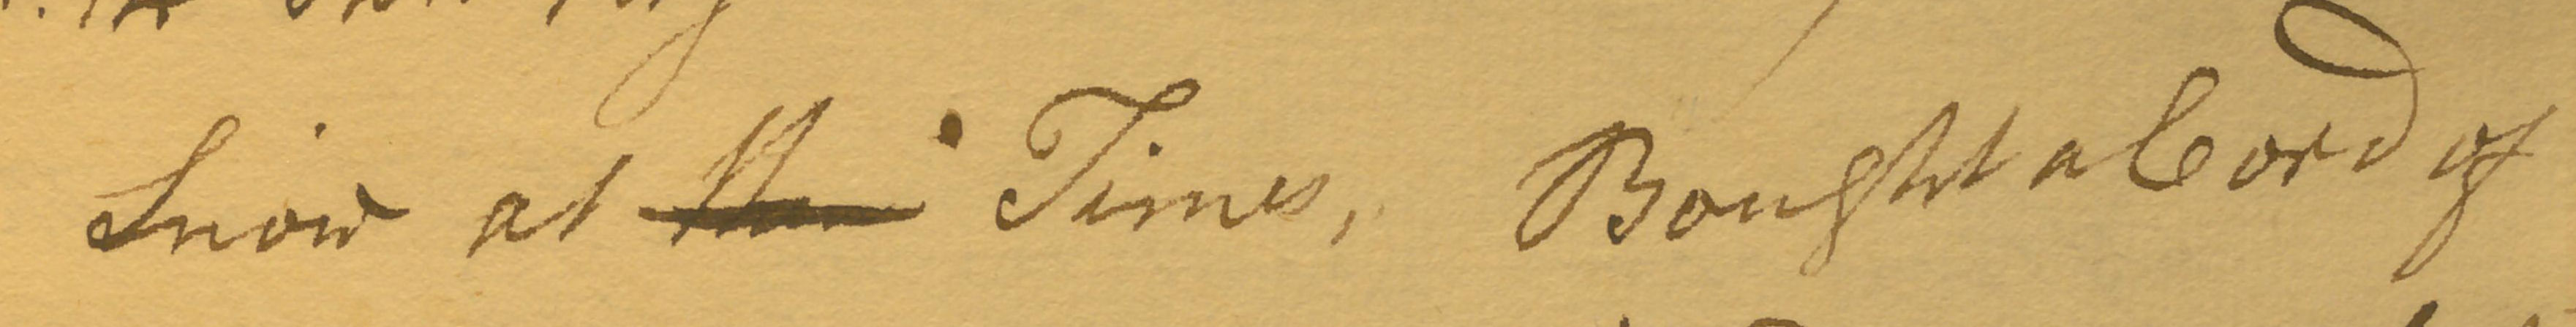snow at [the] Times, Bought a Cord of
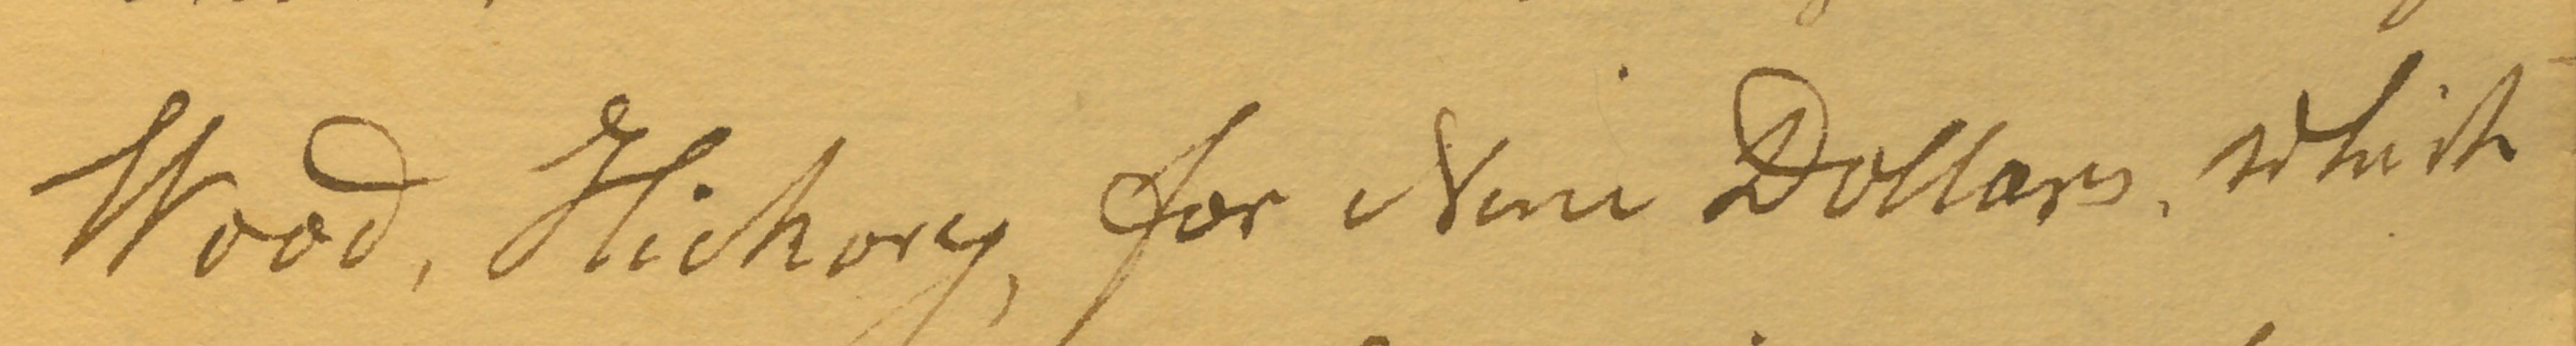Wood, Hickory, for Nine Dollars, which
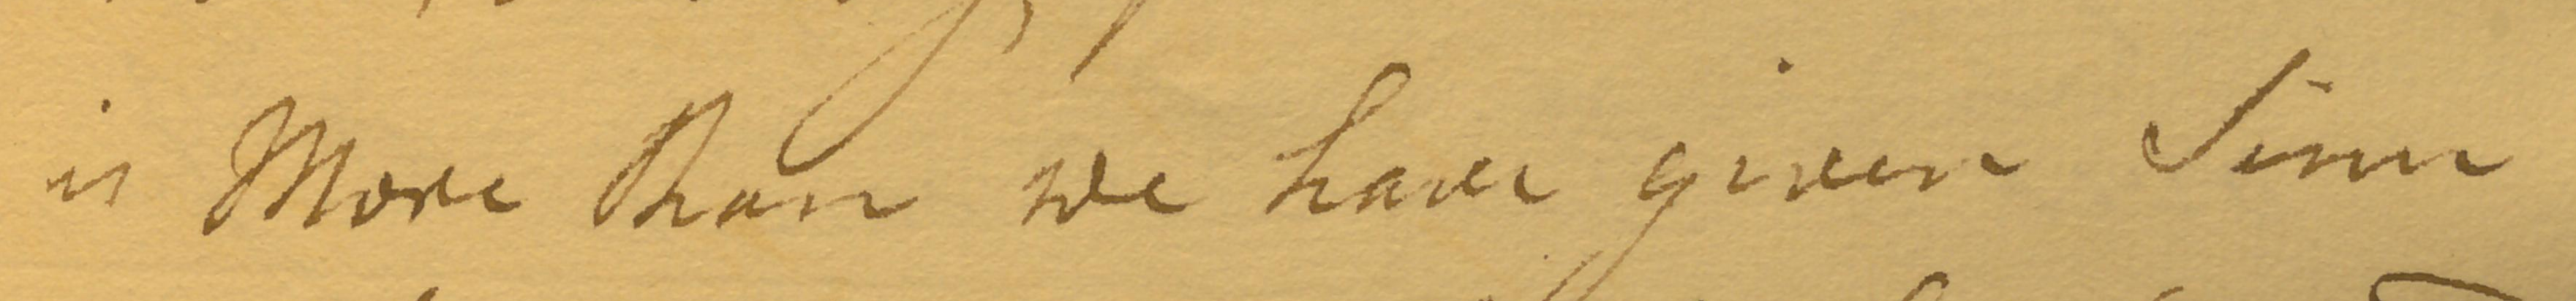is More than we have given since
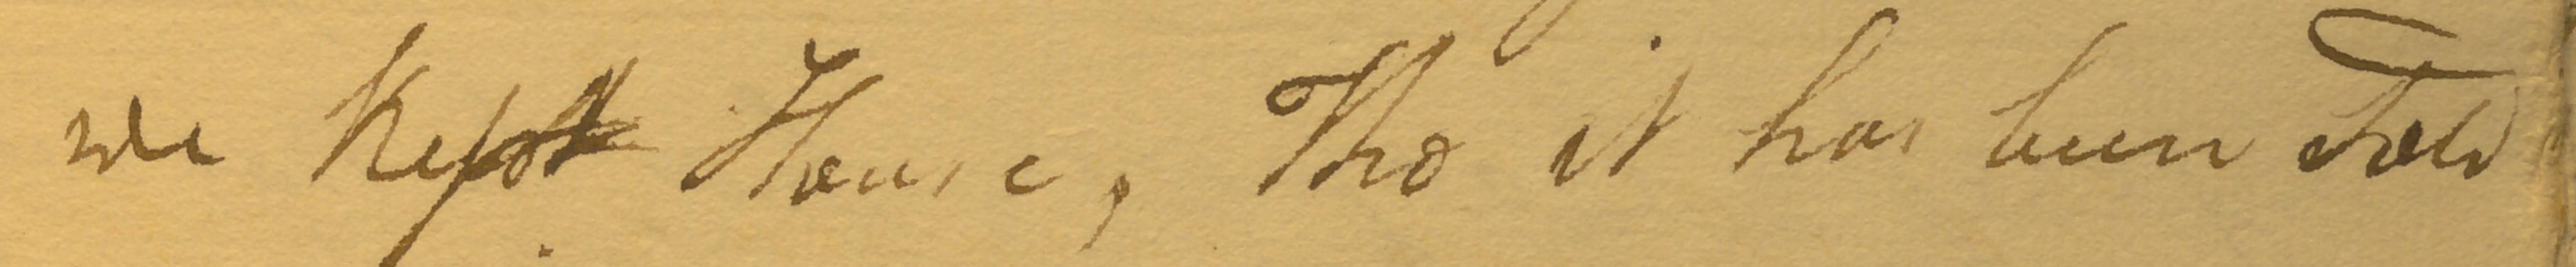we Kept House, Tho it has been sold
